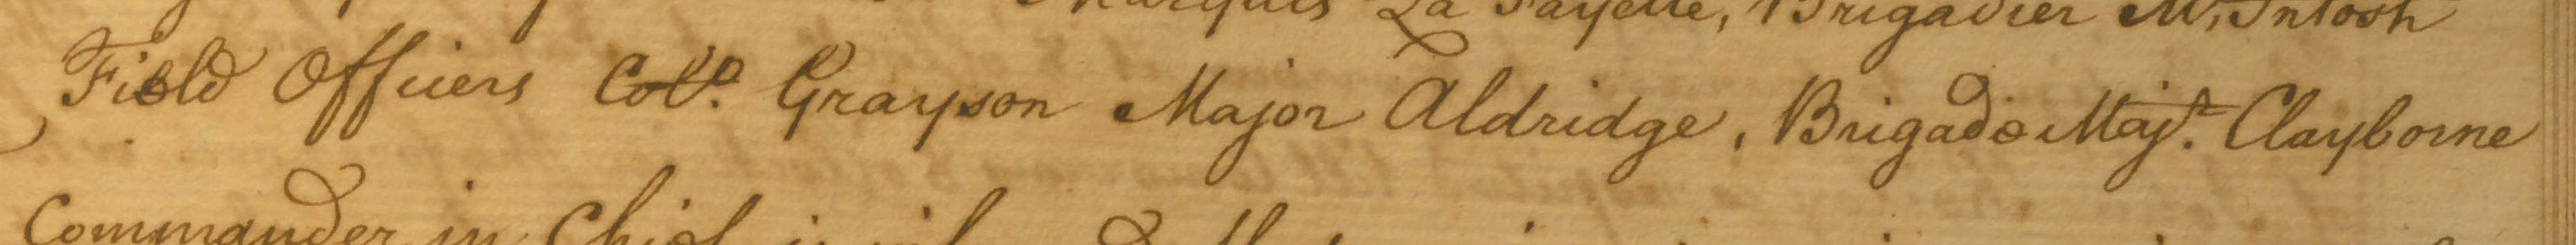Field Officers Col^o. Grayson Major Aldridge, Brigade Maj^r. Clayborne
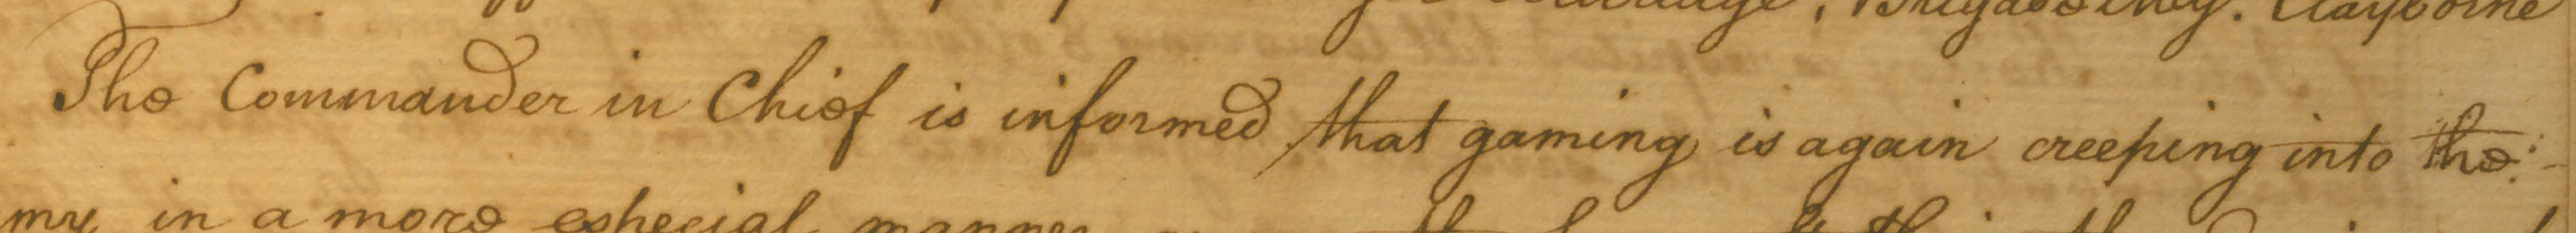The Commander in Chief is informed that gaming is again creeping into the
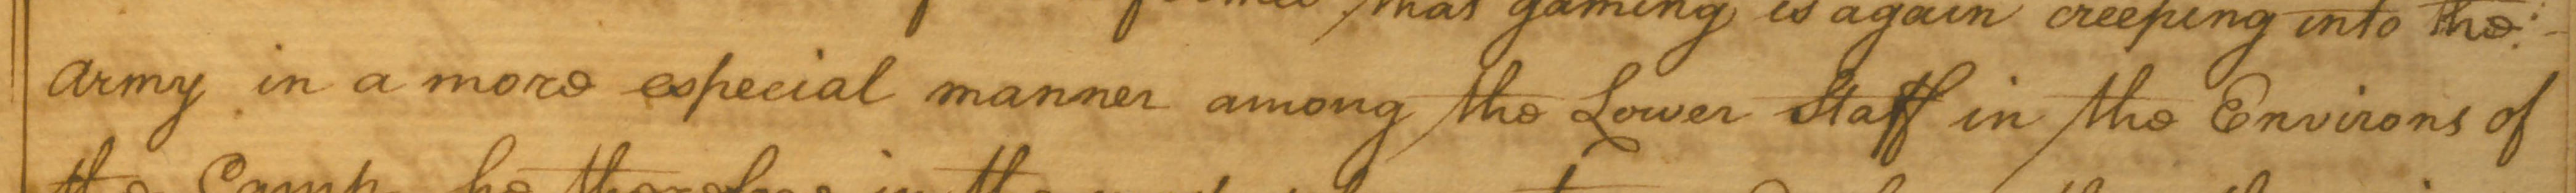army in a more especial manner among the Lower Staff in the Environs of
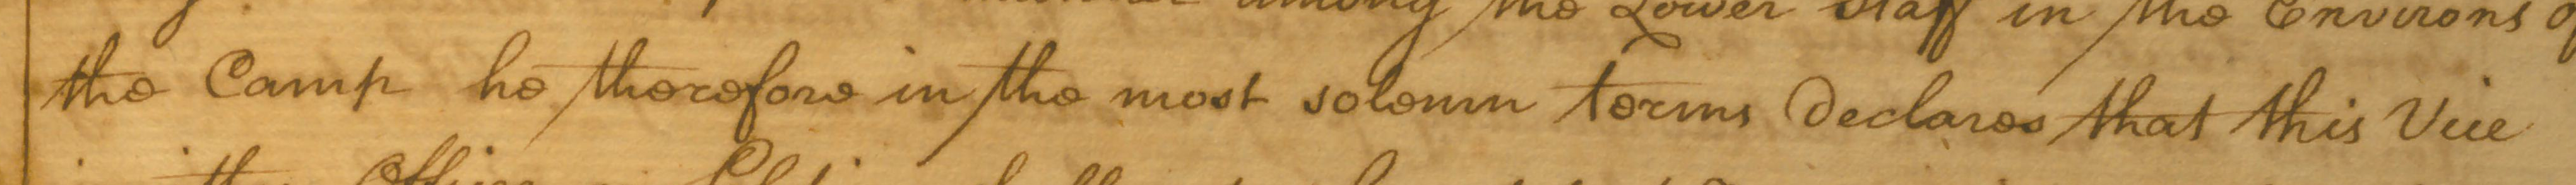the Camp be therefore in the most solemn terms declares that this vice
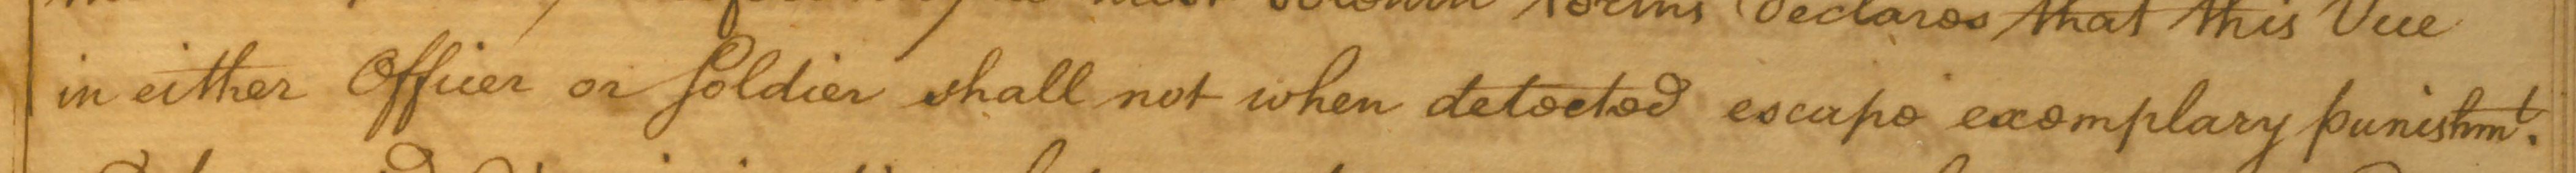in either Officer or Soldier shall not when detected escape exemplary punishm^t.
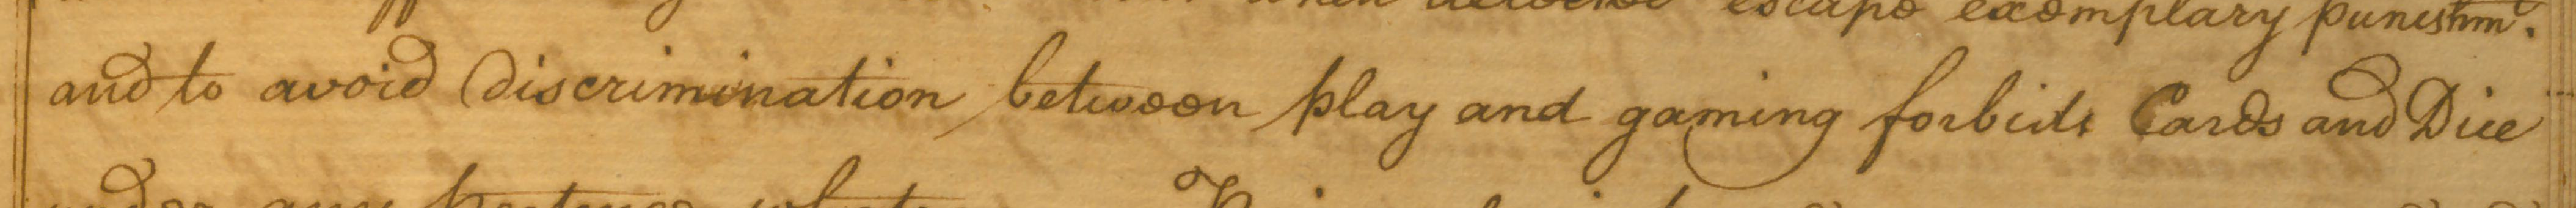and to avoid discrimination between play and gaming forbids Cards and Dice
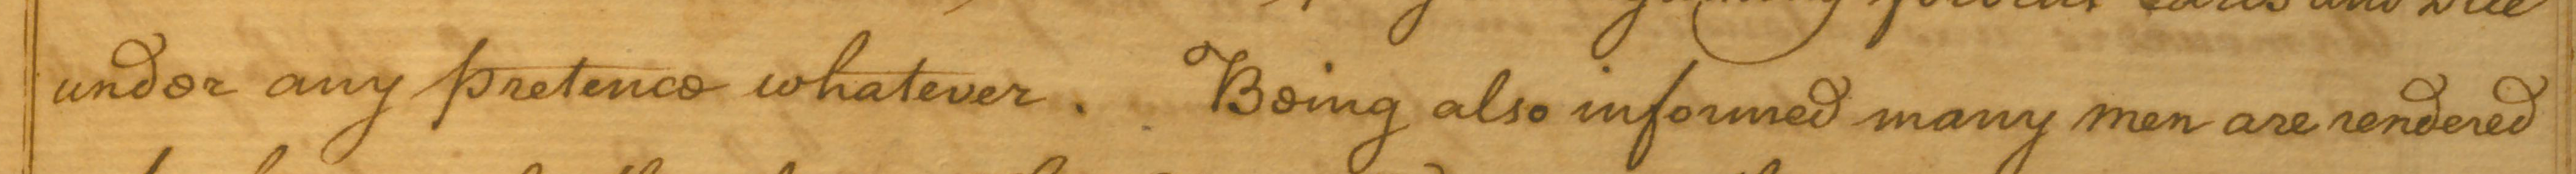under any pretence whatever. Being also informed many men are rendered
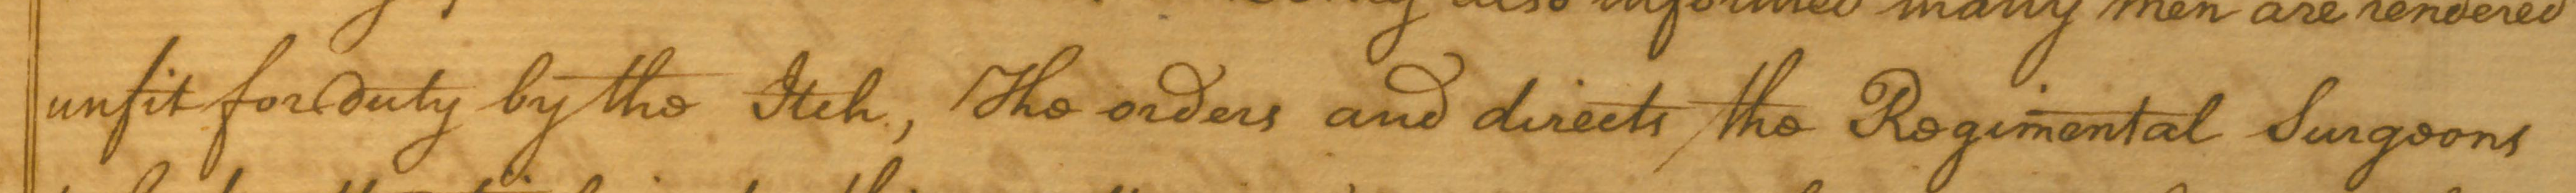unfit for duty by the Itch, He orders and directs the Regimental Surgeons
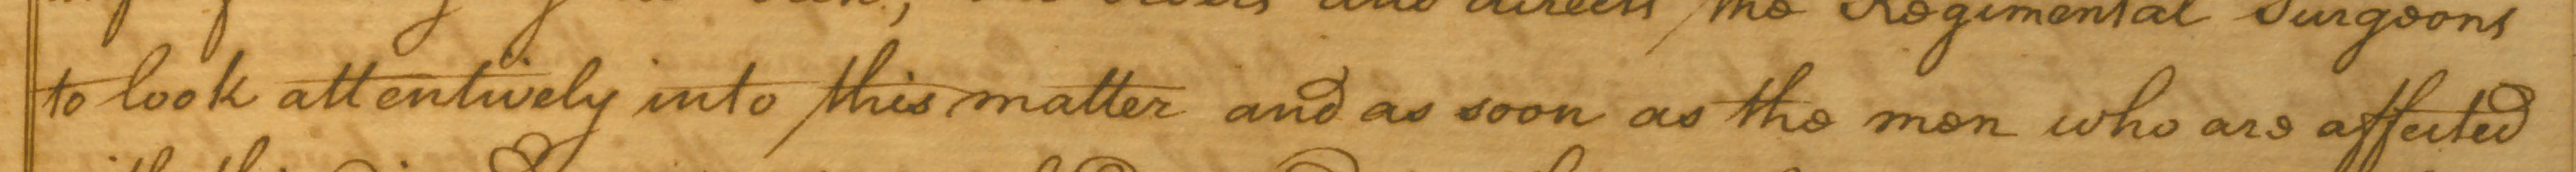to look attentively into this matter and as soon as the men who are affected
